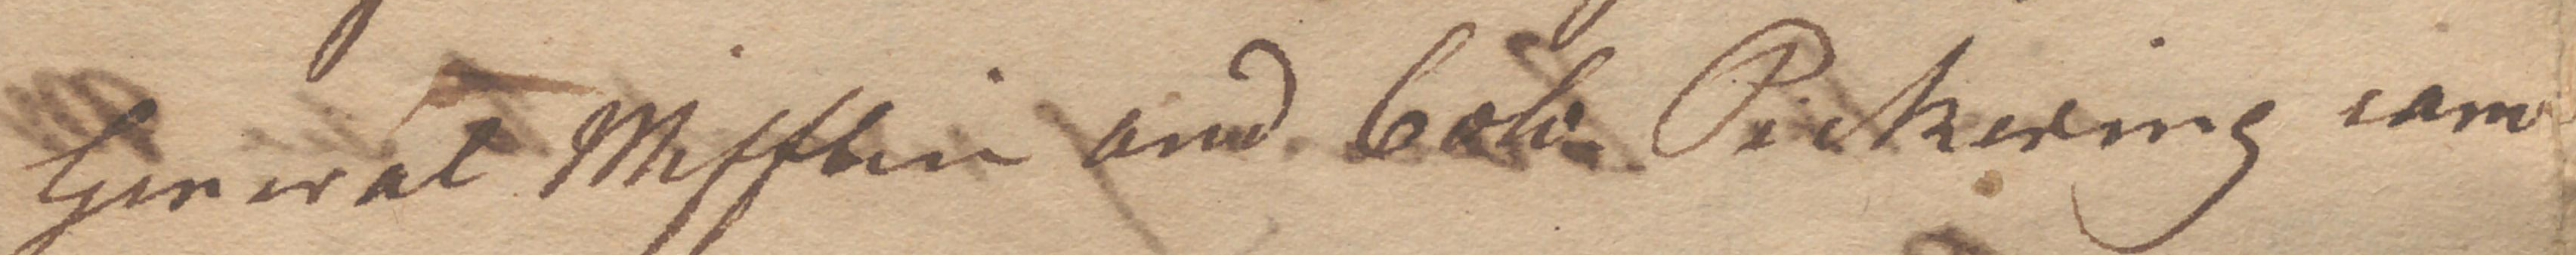General Mifflin and Colo Pickering cam
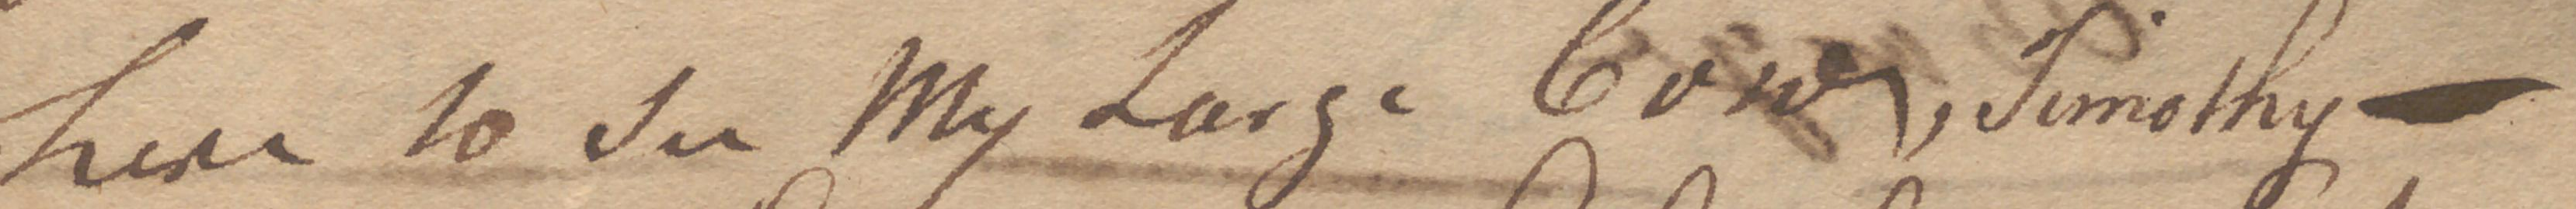here to see My Large Cow, Timothy
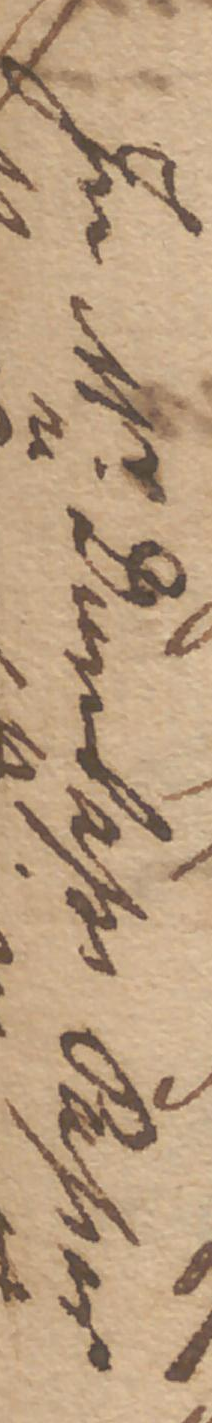In M^r. Dunlaps Paper
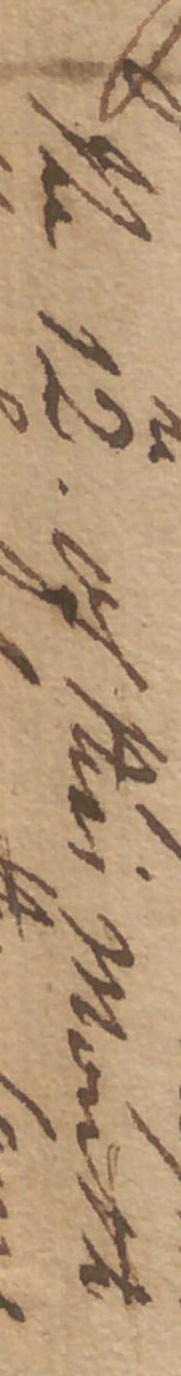the 12^th. of this month
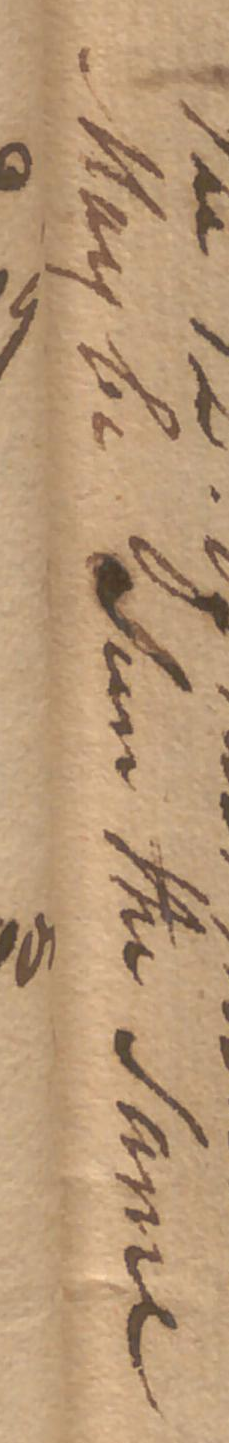May be seen the Same
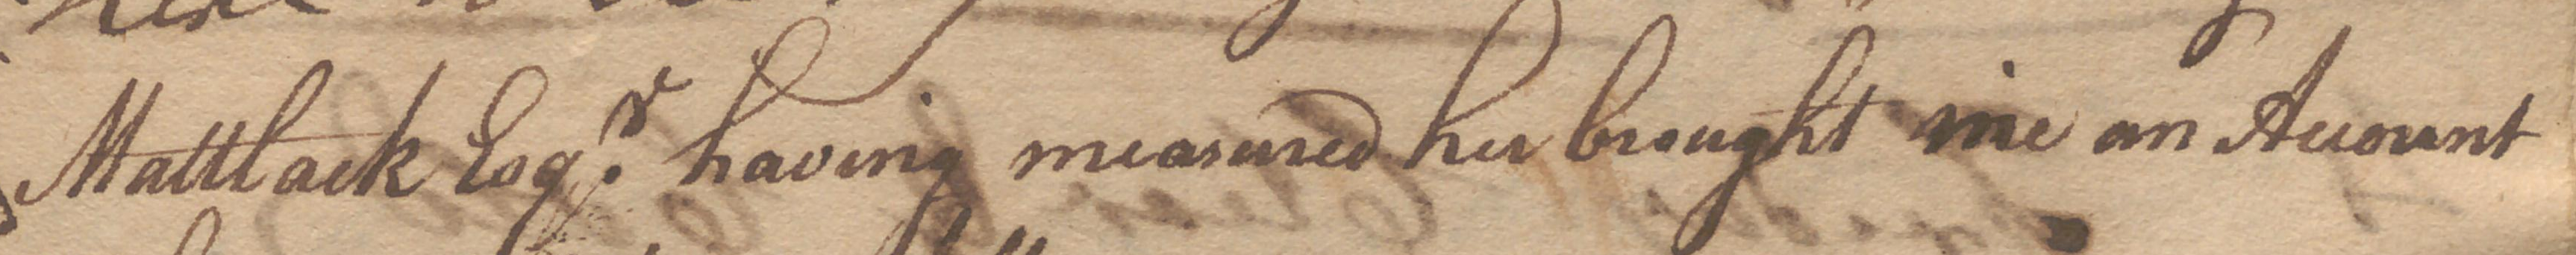Mattlack Esq^r. having measured her brought me an Account
